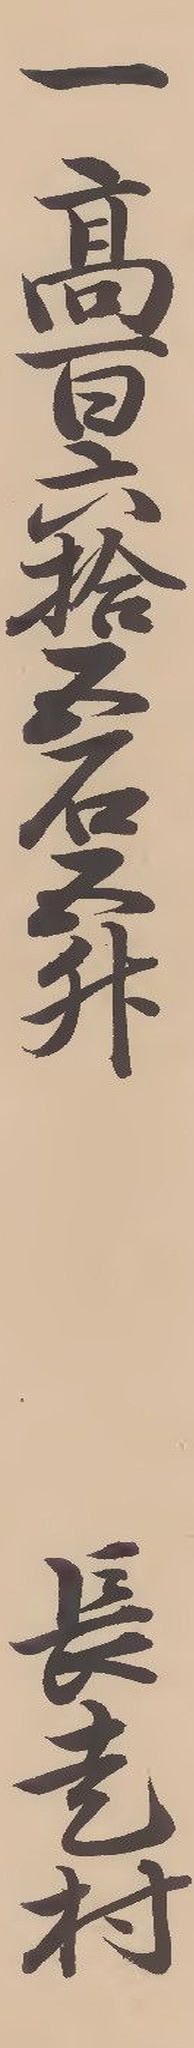一高百六拾五石五升長走村
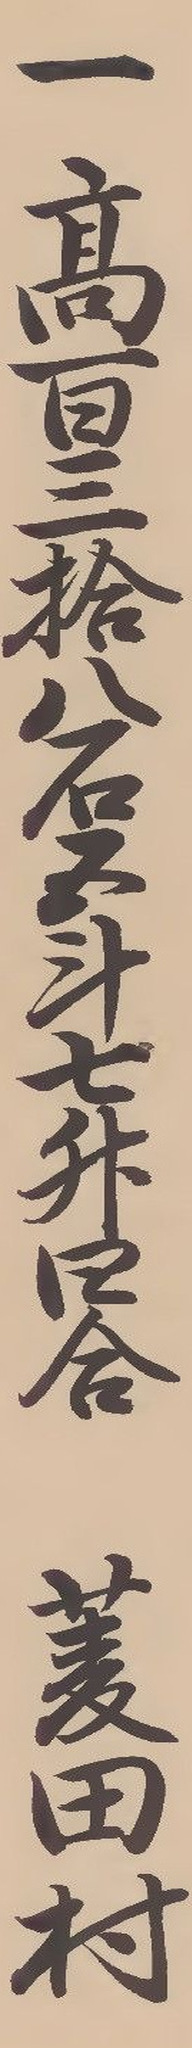一高百三拾八石五斗七升四合菱田村

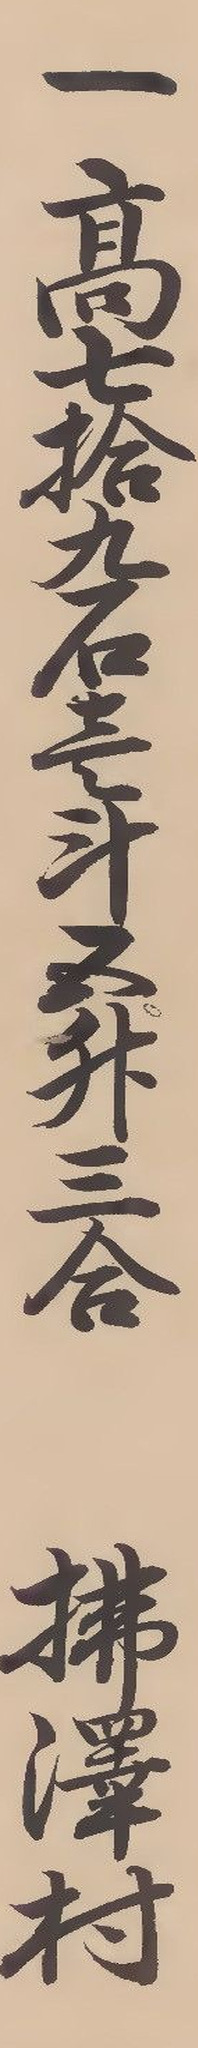一高七拾九石壱斗五升三合払沢村
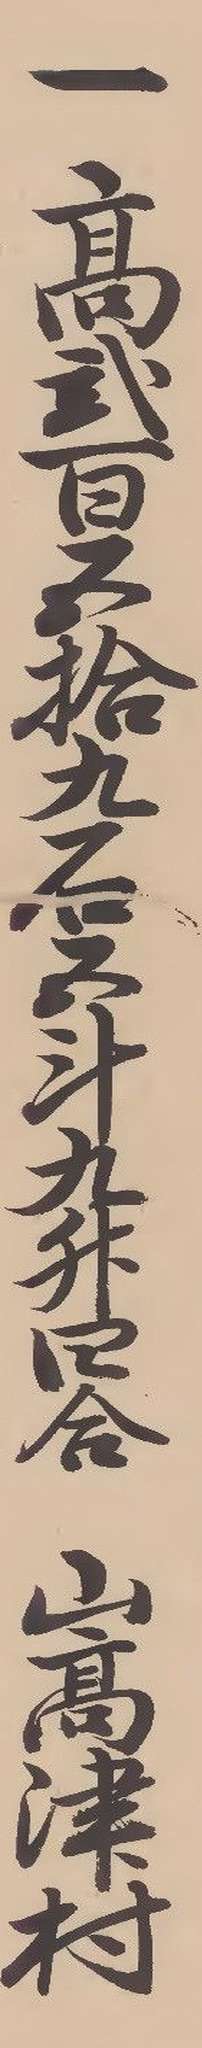一高弐百五拾九石五斗九升四合山高津村
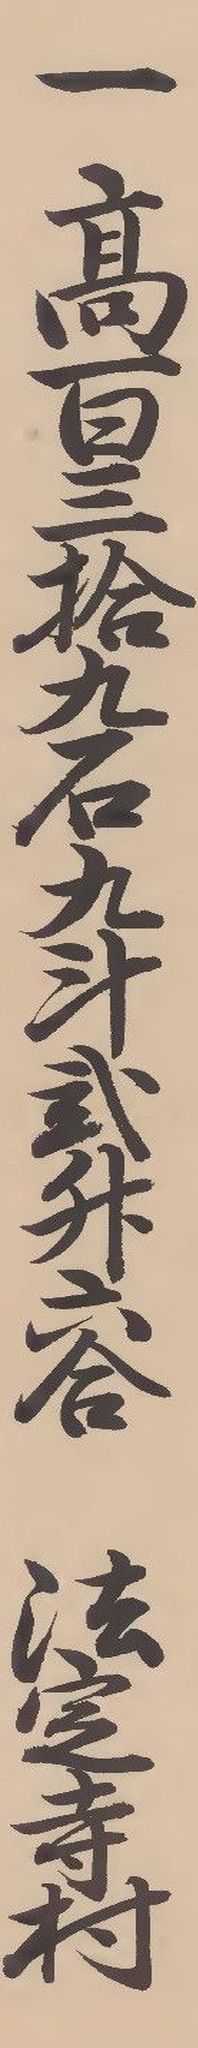一高百三拾九石九斗弐升六合法定寺村
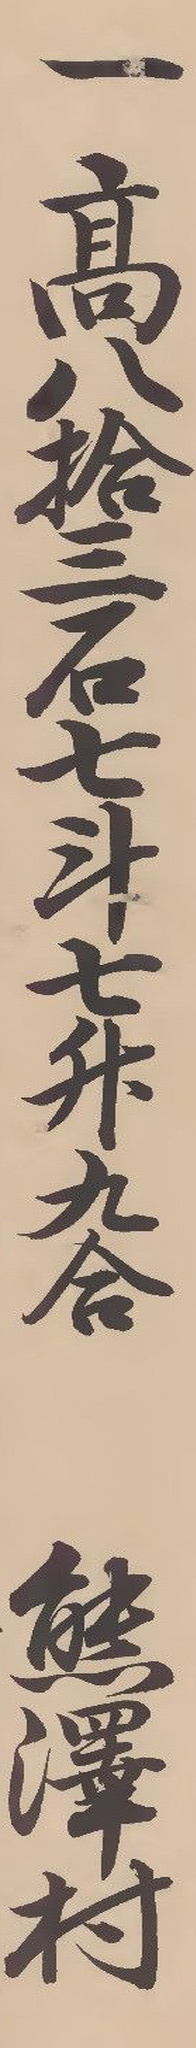一高八拾三石七斗七升九合熊沢村
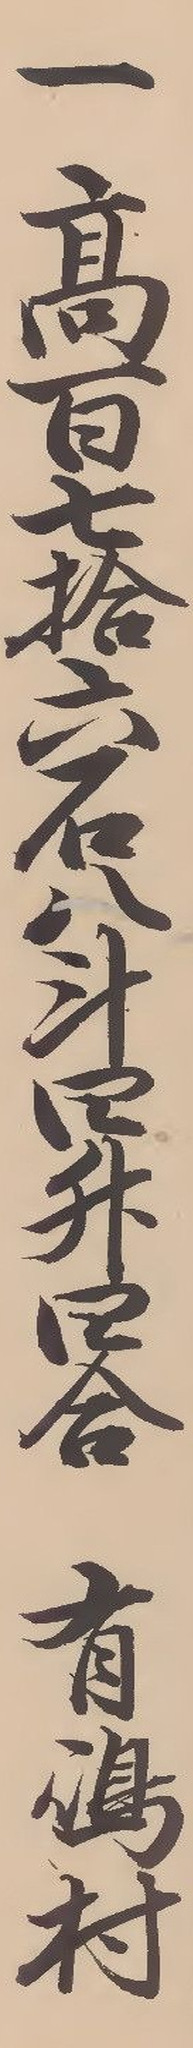一高百七拾六石八斗四升四合有島村
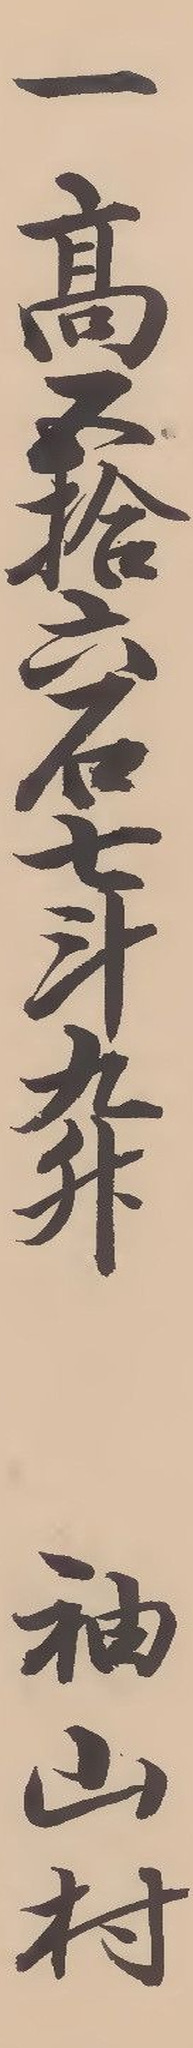一高五拾六石七斗九升袖山村
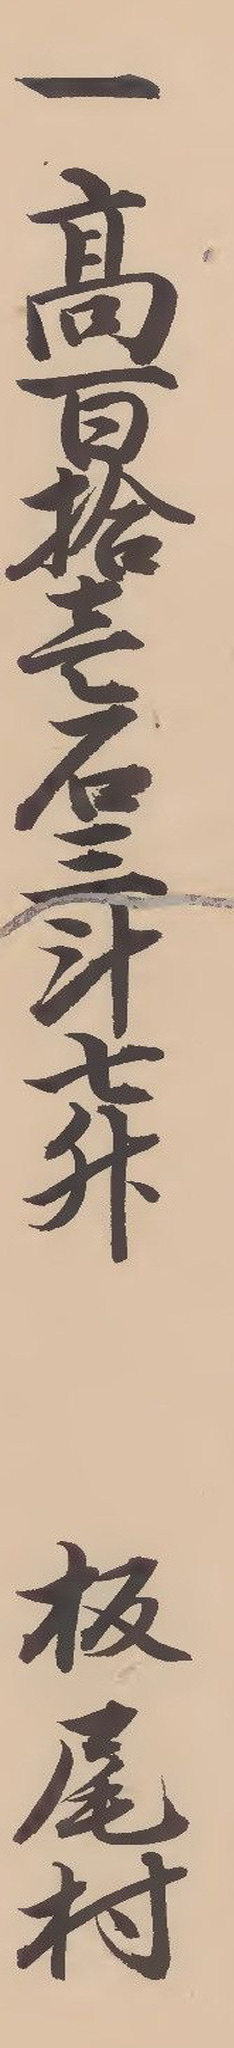一高百拾壱石三斗七升板尾村
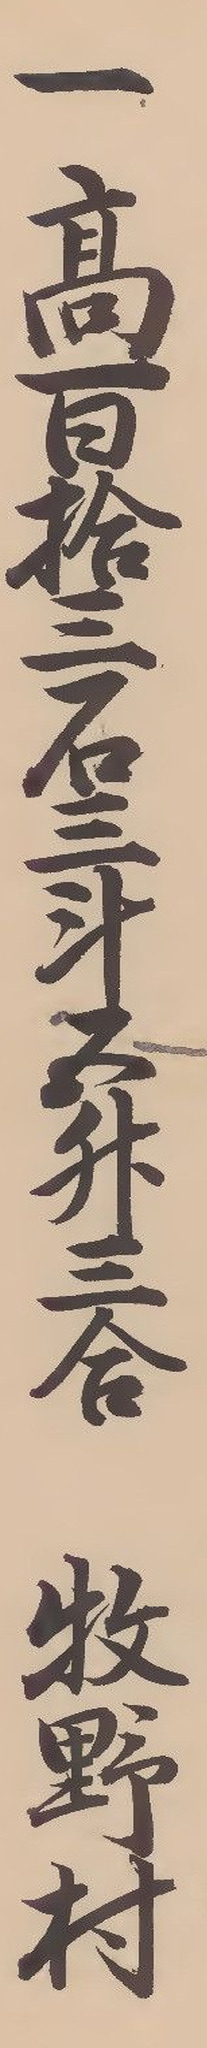一高百拾三石三斗五升三合牧野村

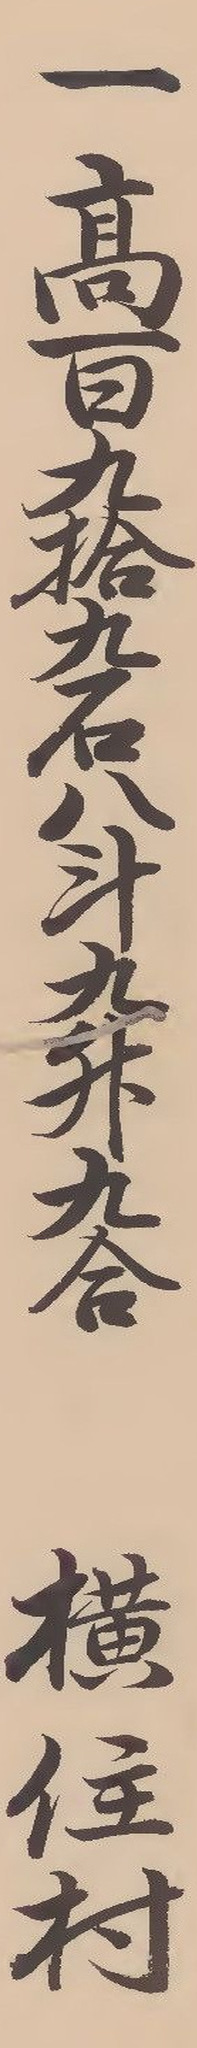一高百九拾九石八斗九升九合横住村
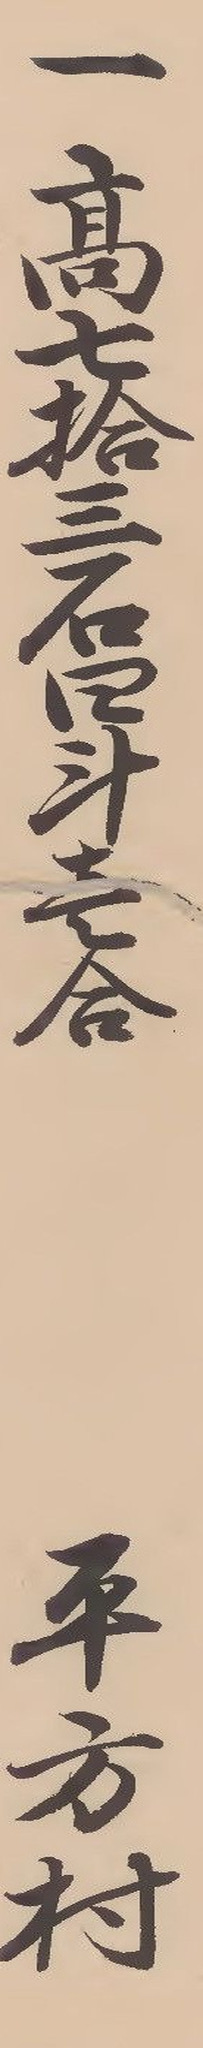一高七拾三石四斗壱合平方村
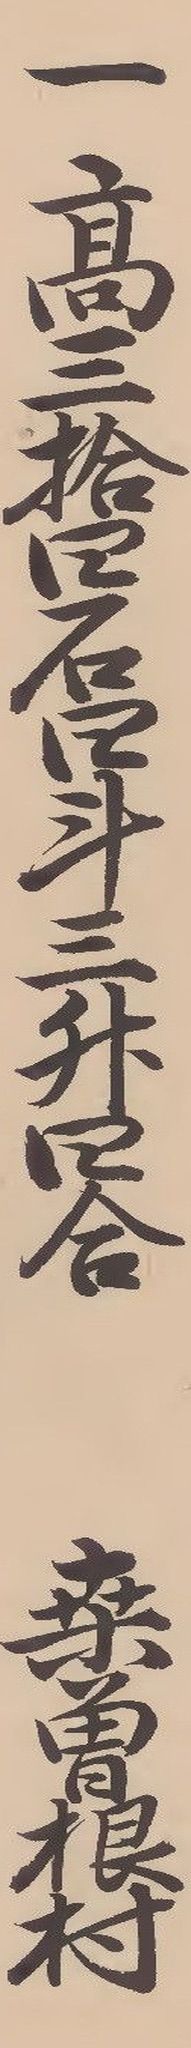一高三拾四石四斗三升四合桑曽根村
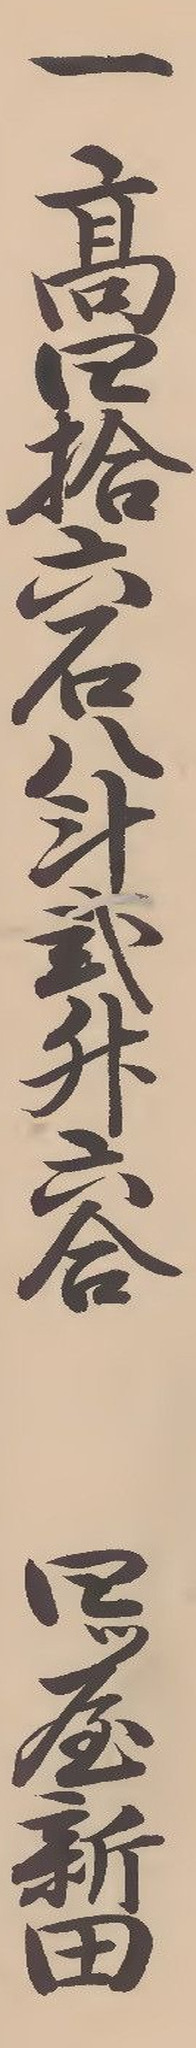一高四拾六石八斗弐升六合四ツ屋新田
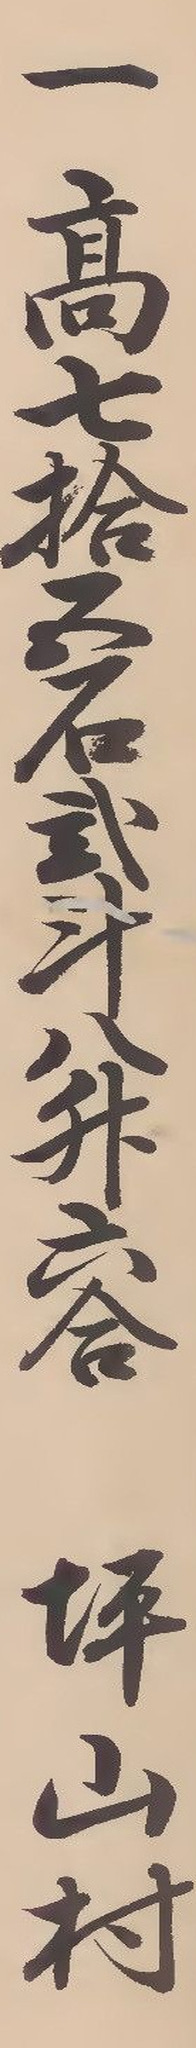一高七拾五石弐斗八升六合坪山村
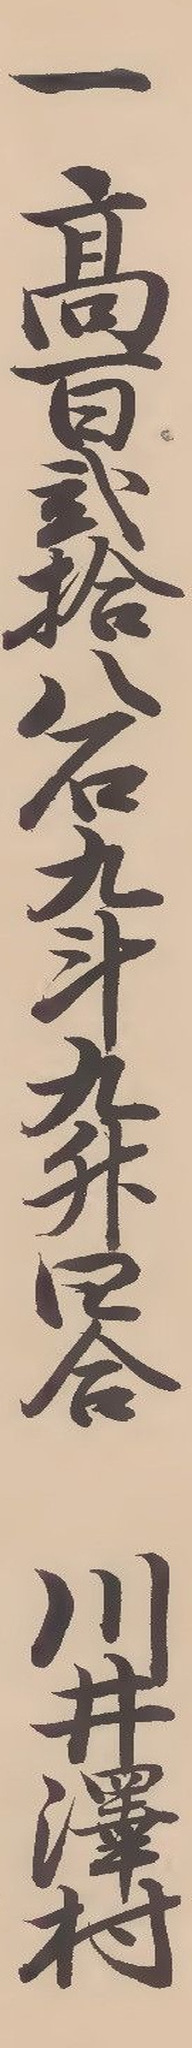一高百弐拾八石九斗九升四合川井沢村
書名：越後国郷帳　上
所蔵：国立公文書館 National Archives of Japan
